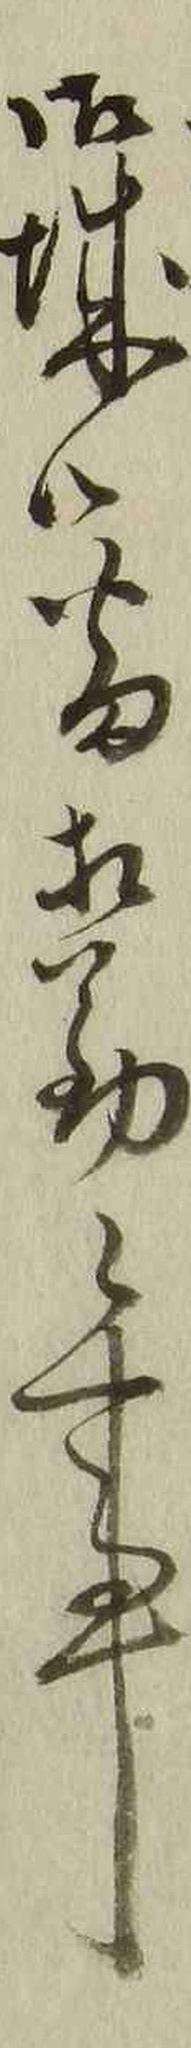御城御番相勤候事
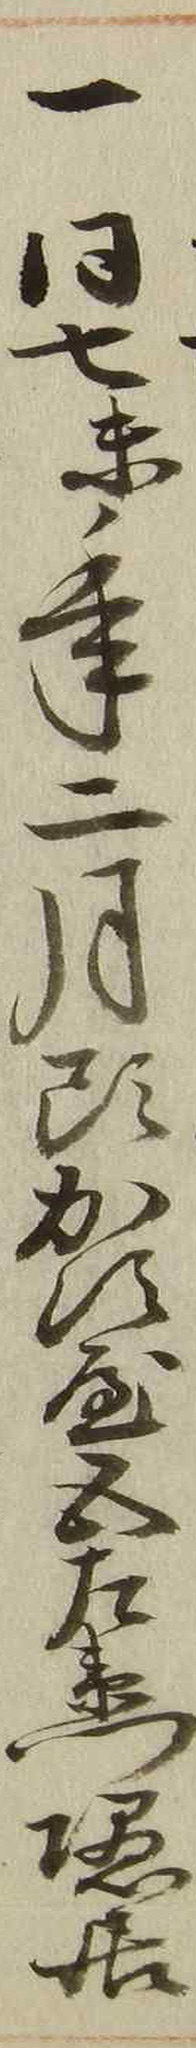一同七未年二月頭加須屋五左衛門隠居
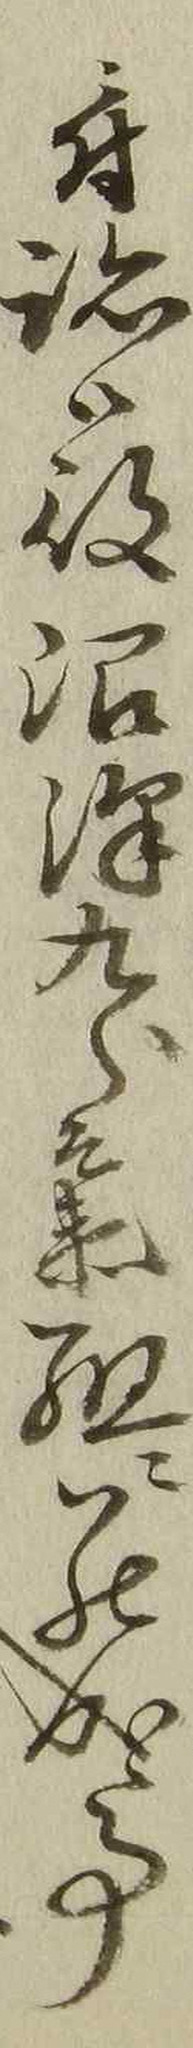ニ付跡御役沼沢九郎兵衛組ニ罷成候事
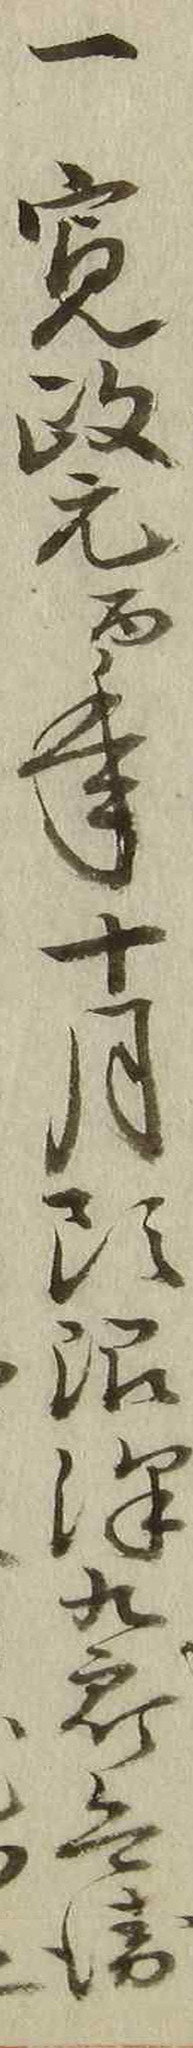一寛政元酉年十月頭沼沢九郎兵衛
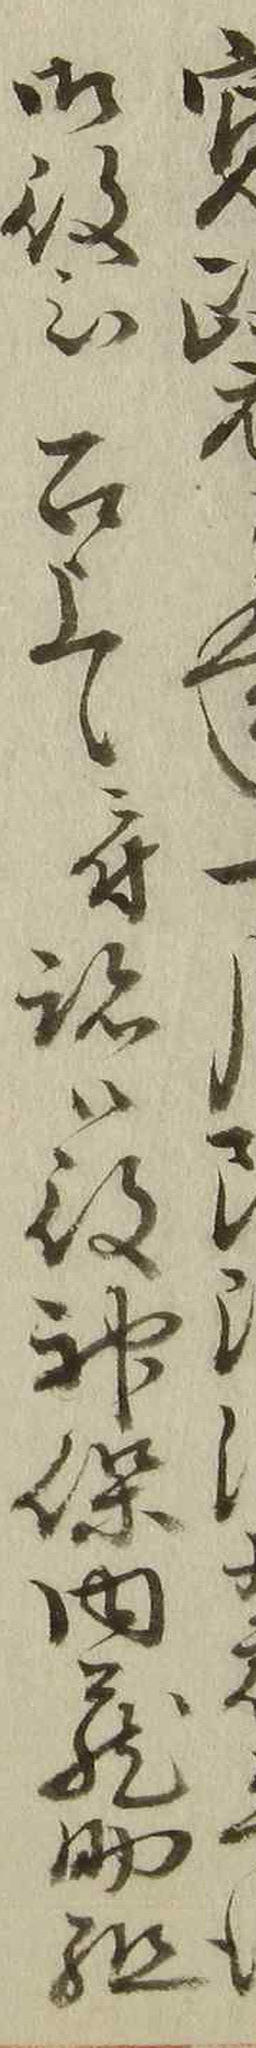御役被召上候ニ付跡御役神保内蔵助組
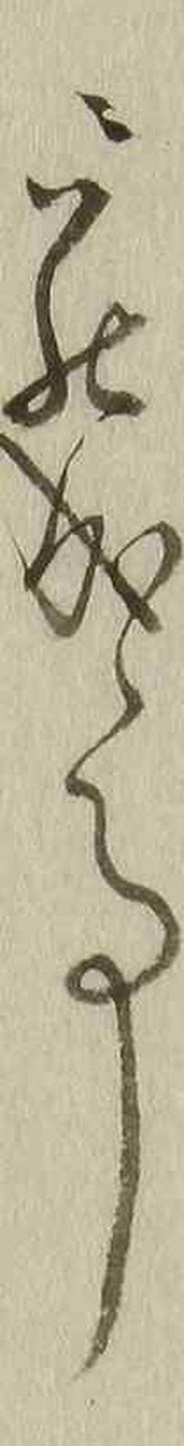ニ罷成候事
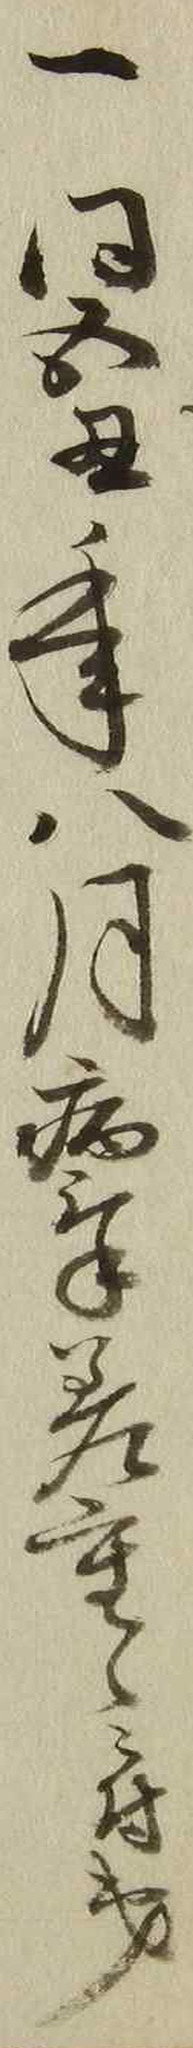一同五丑年八月病気差重候ニ付弟
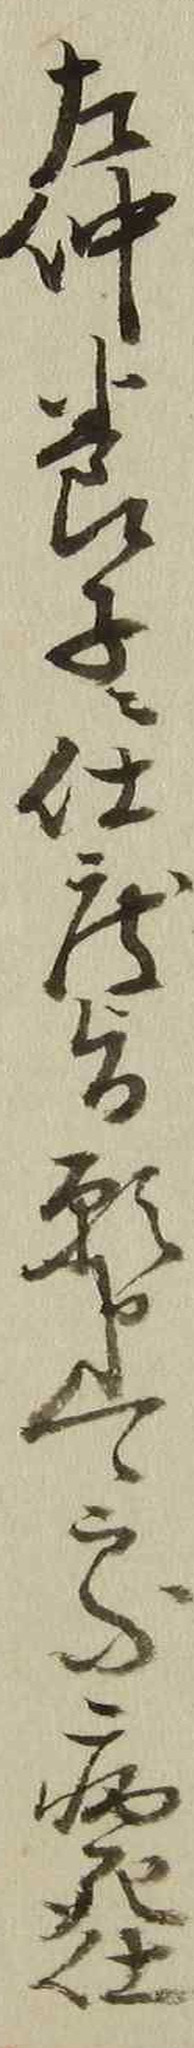左仲養子ニ仕度旨願申上候処病死仕
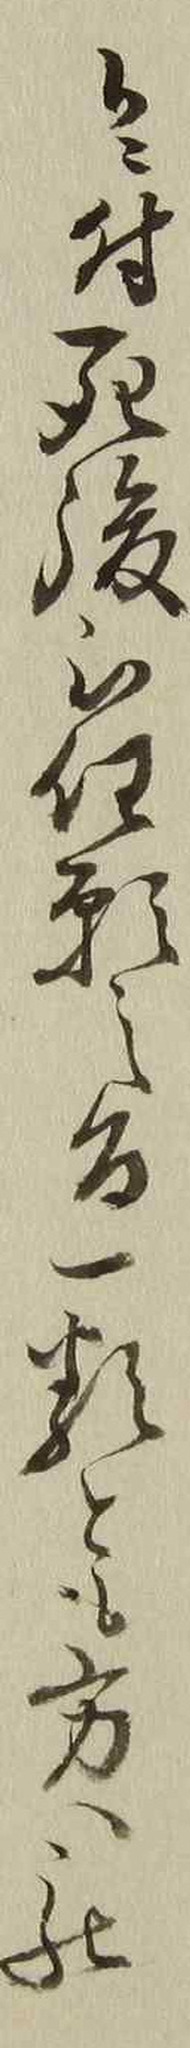候ニ付死後被任願之旨一類とも方へ被
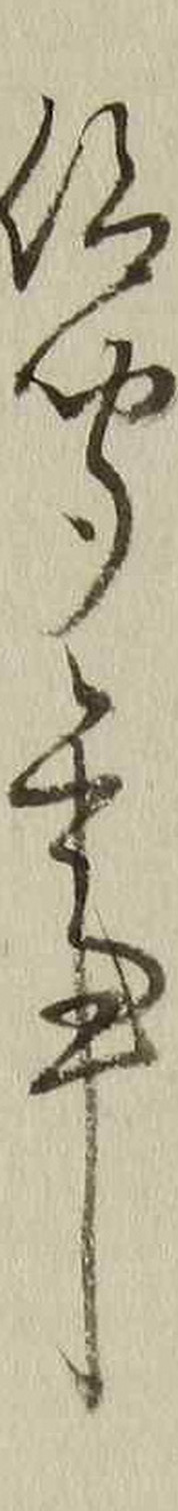仰聞候事
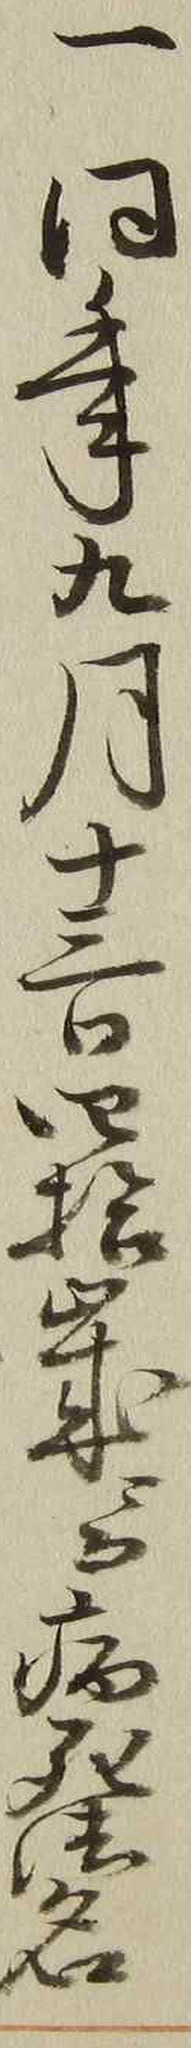一同年九月十三日四拾歳ニ而病死法名
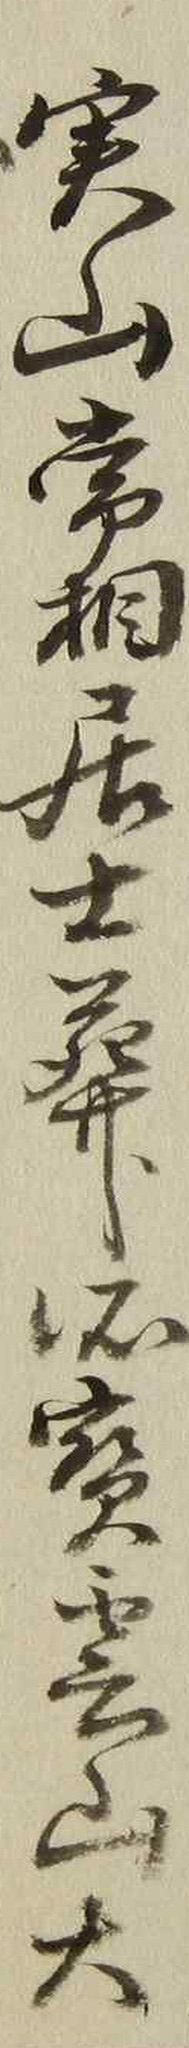実山常相居士葬所宝雲山大
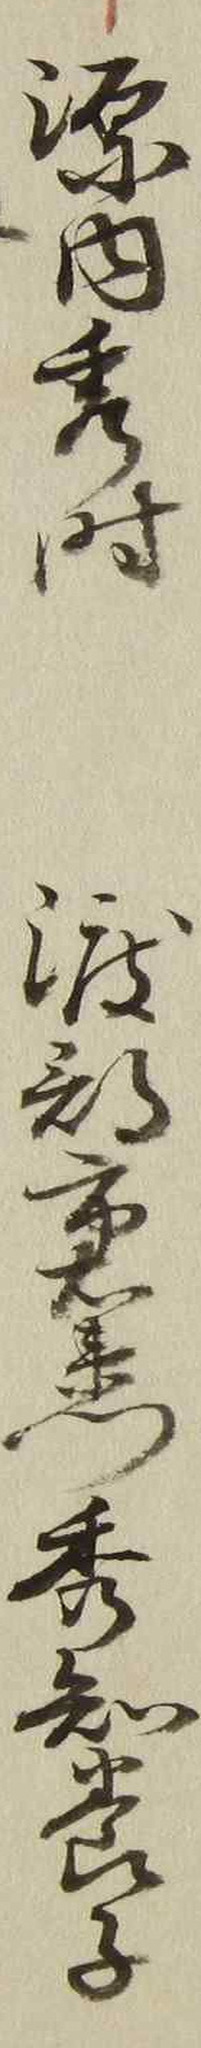源内秀時渡部市右衛門秀知養子
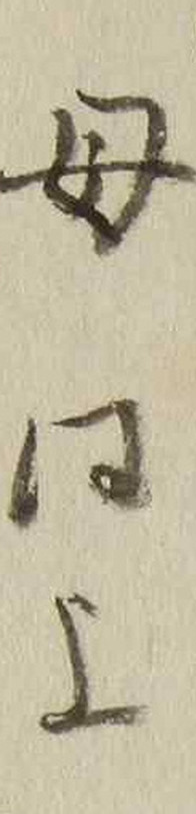母同上
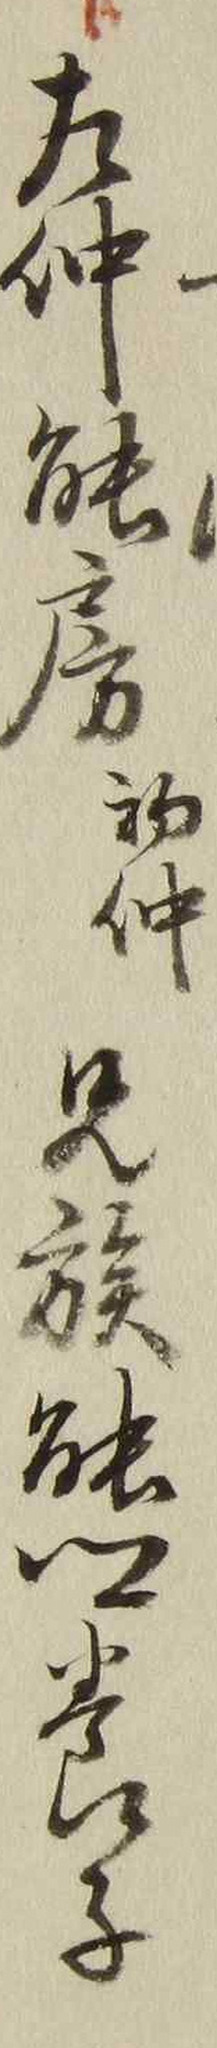左仲能房初仲兄族能郷養子
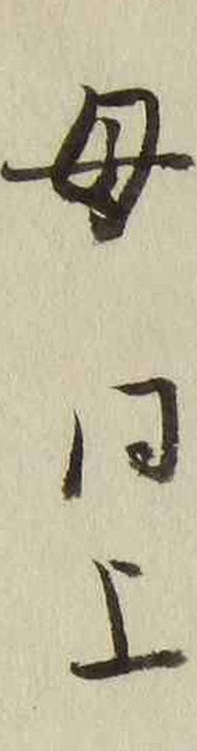母同上
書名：諸士系譜　巻之53　に之部4
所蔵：会津若松市立会津図書館
